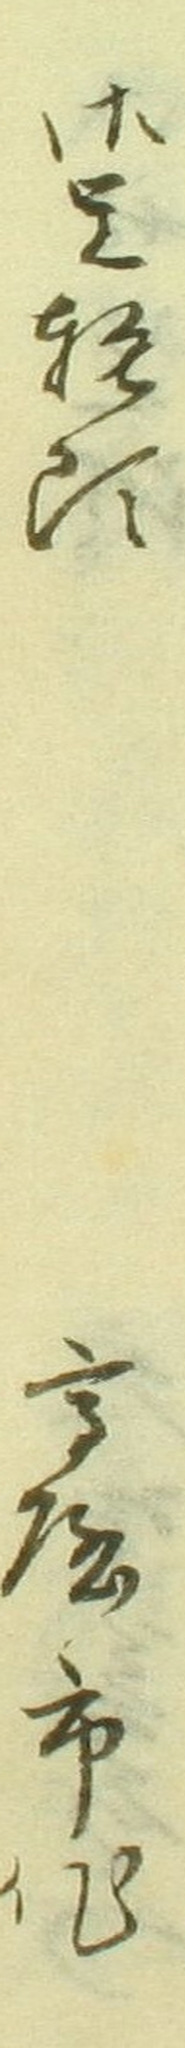御足軽頭高屋市作
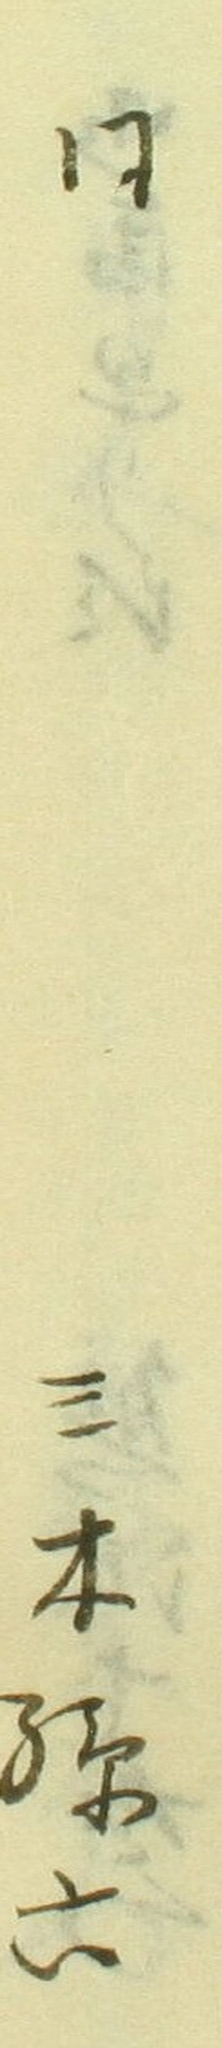同三木孫六
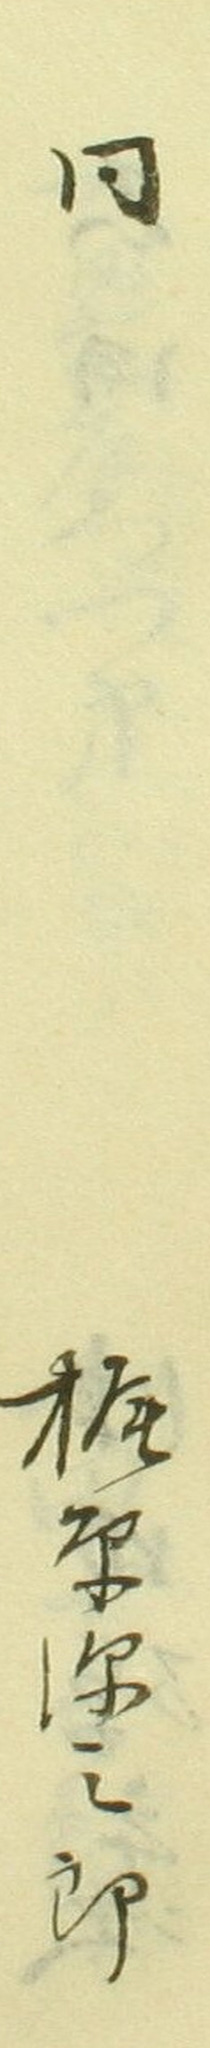同梶原源三郎
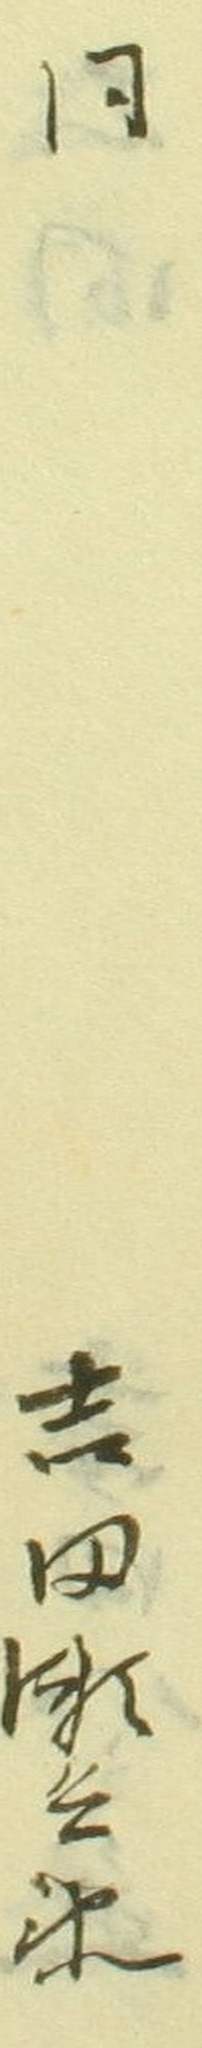同吉田瀬兵衛
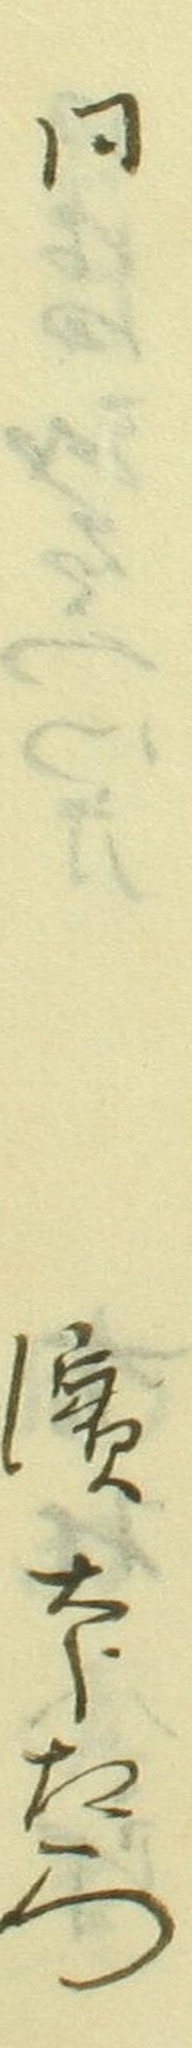同浜太郎左衛門
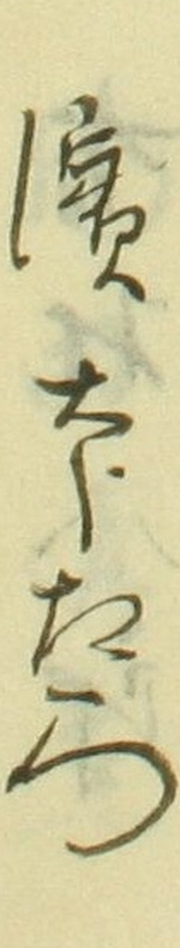同浜太郎左衛門
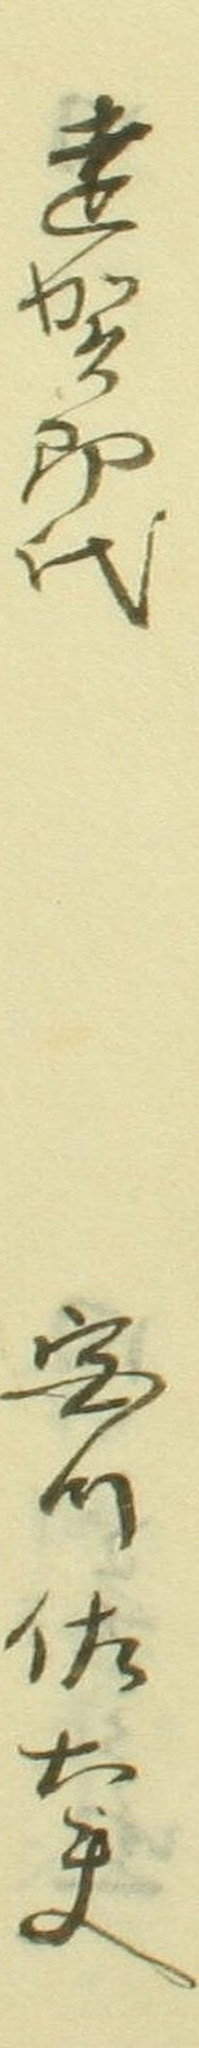遠賀郡代宮川佐大夫
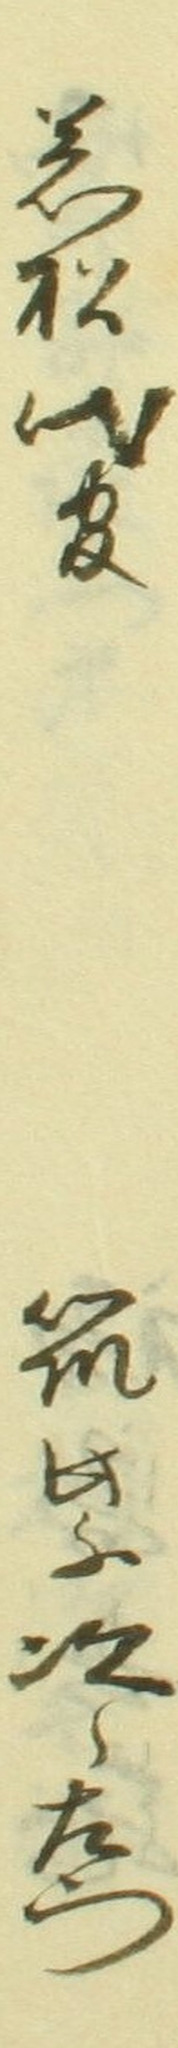若松代官筑紫次郎左衛門
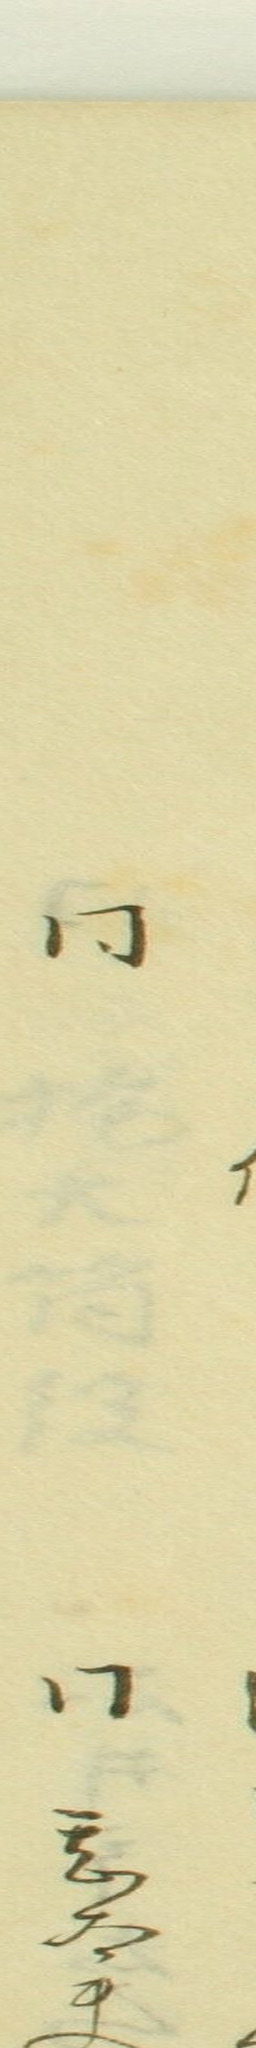同同甚太夫
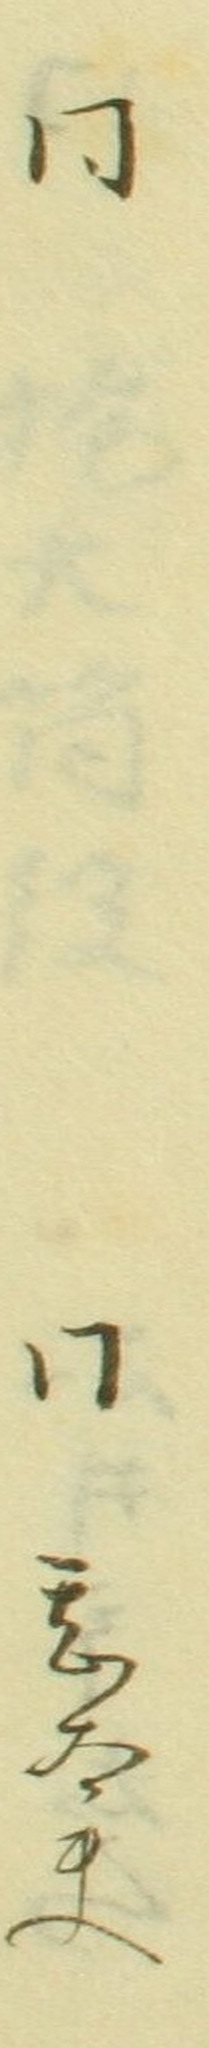同同甚太夫

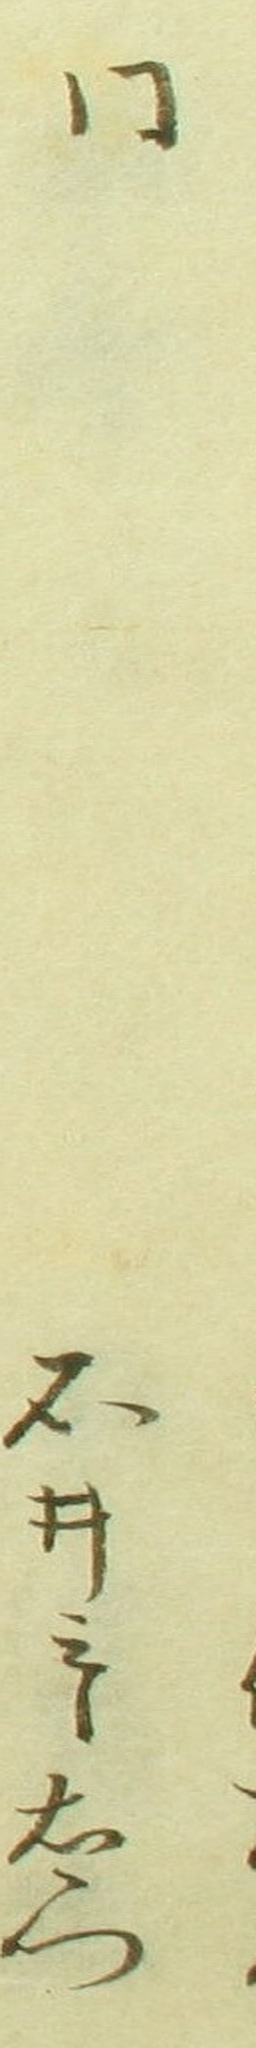同石井市右衛門
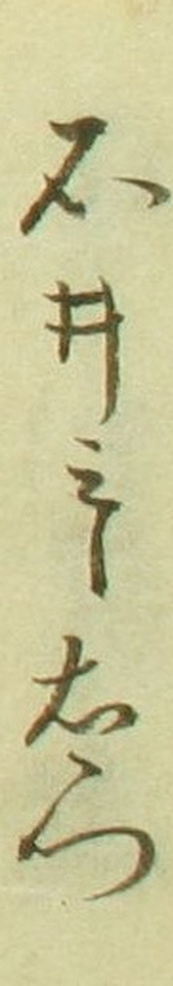同石井市右衛門
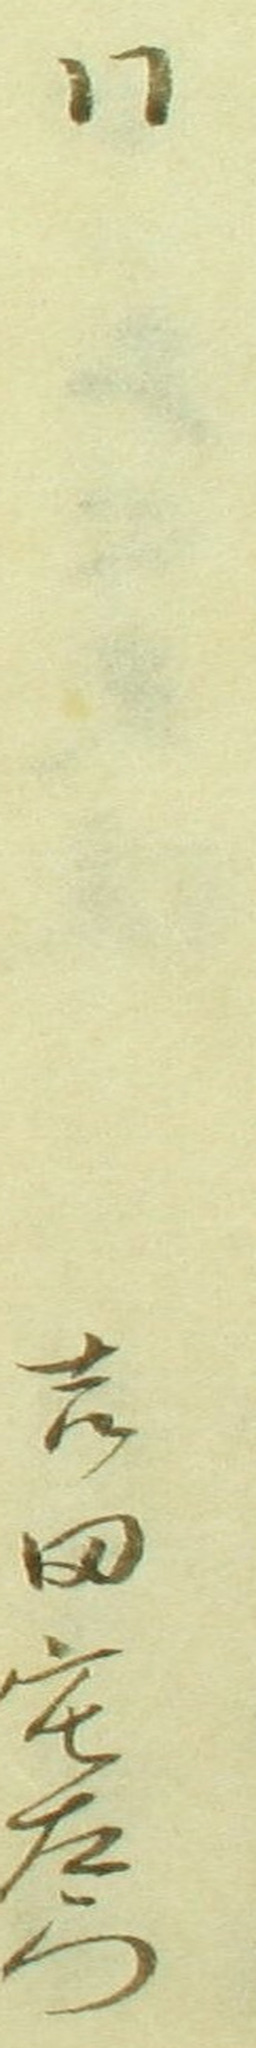同吉田宅左衛門
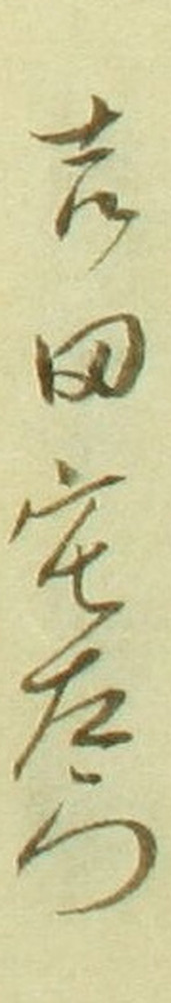同吉田宅左衛門
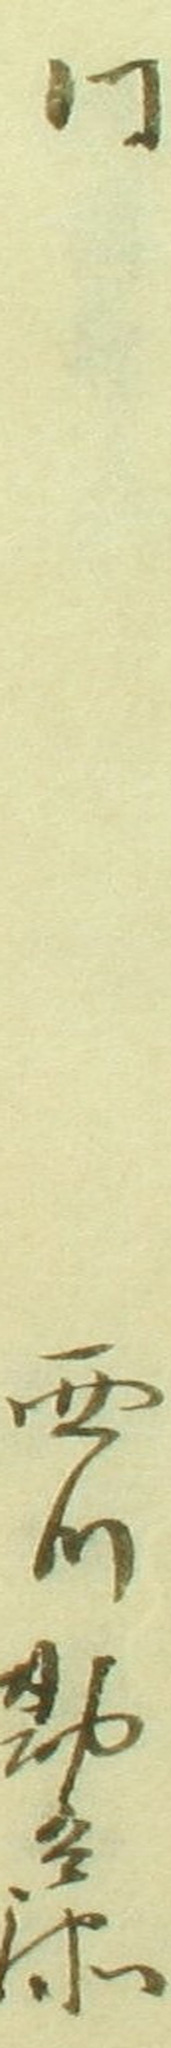同西川勘兵衛
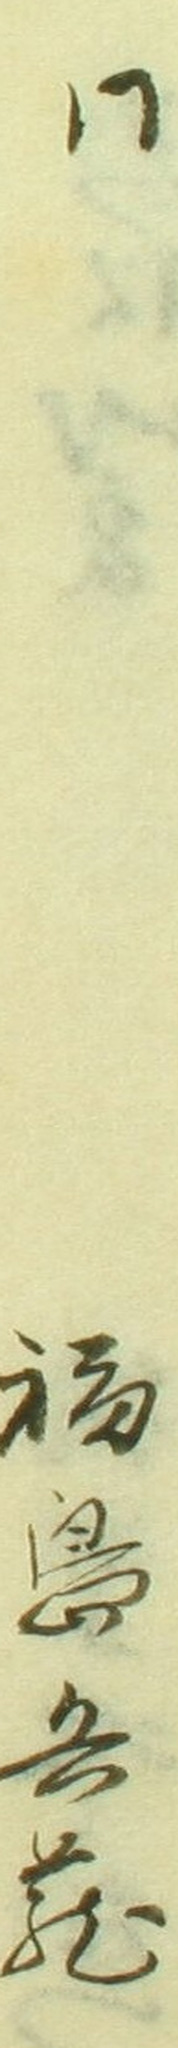同福島兵蔵
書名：唐船漂流記 二
